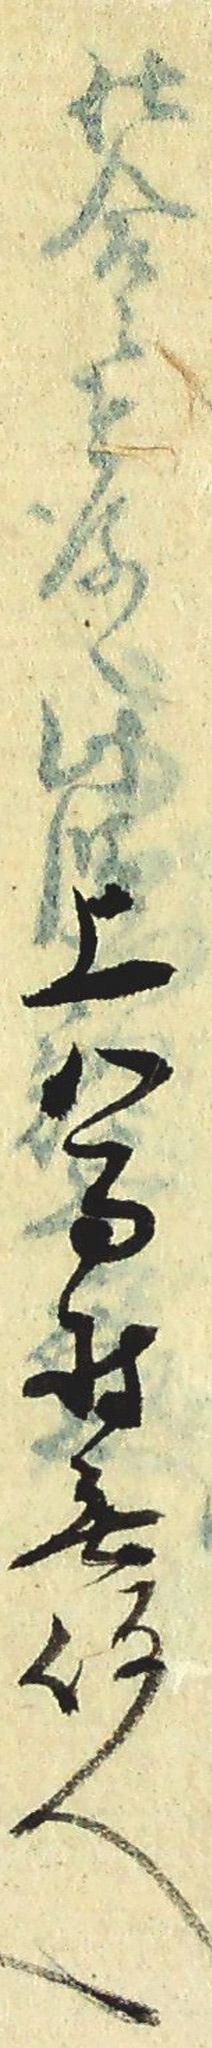上八万村無役人
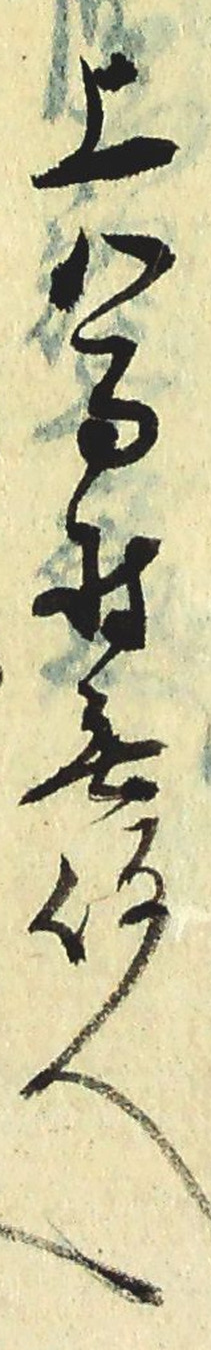上八万村無役人
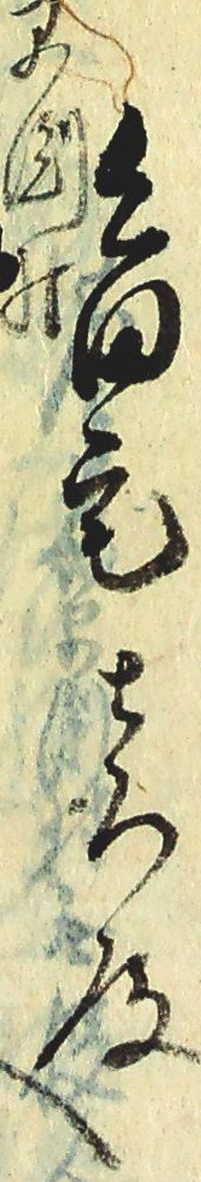今田宅右衛門殿
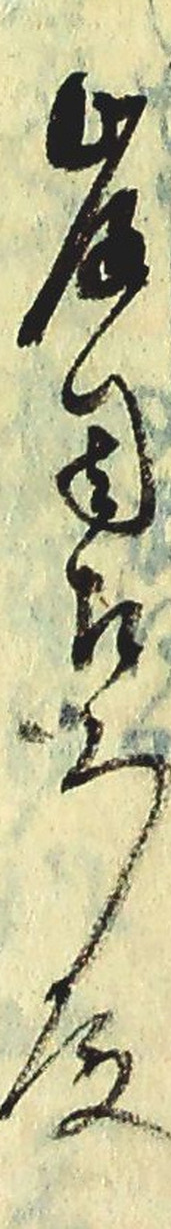岸周左衛門殿
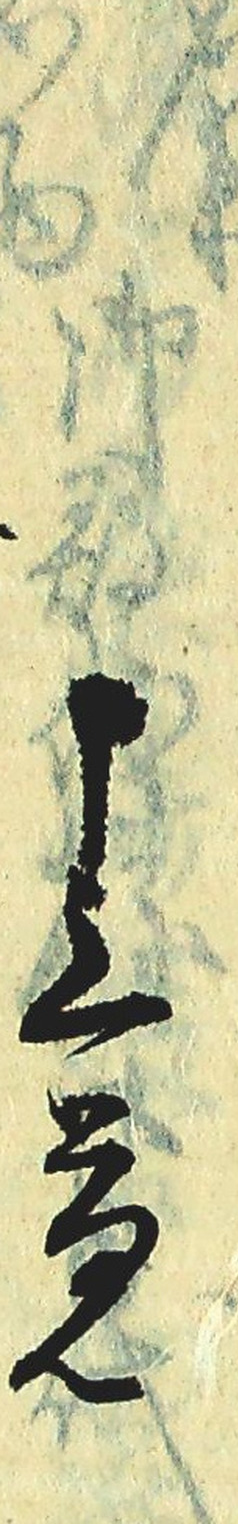申上覚
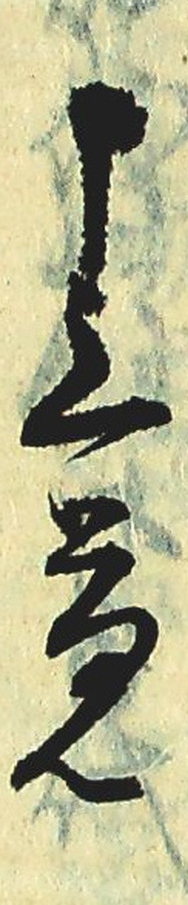申上覚
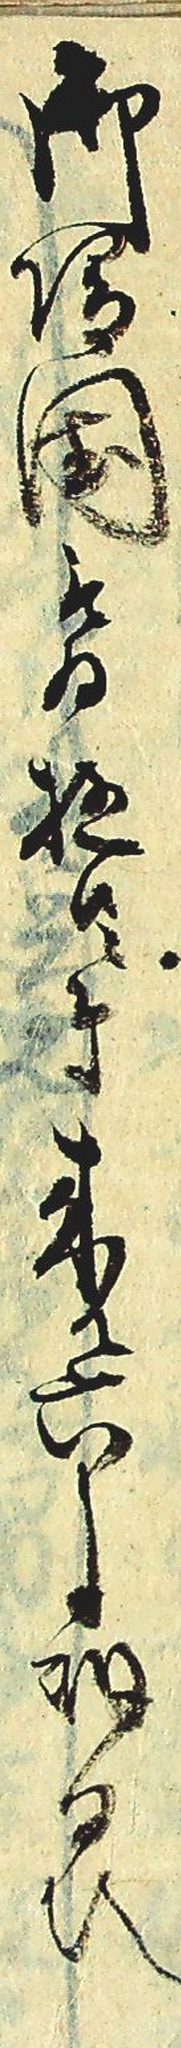御帰国被為遊候に付来る六月朔日比
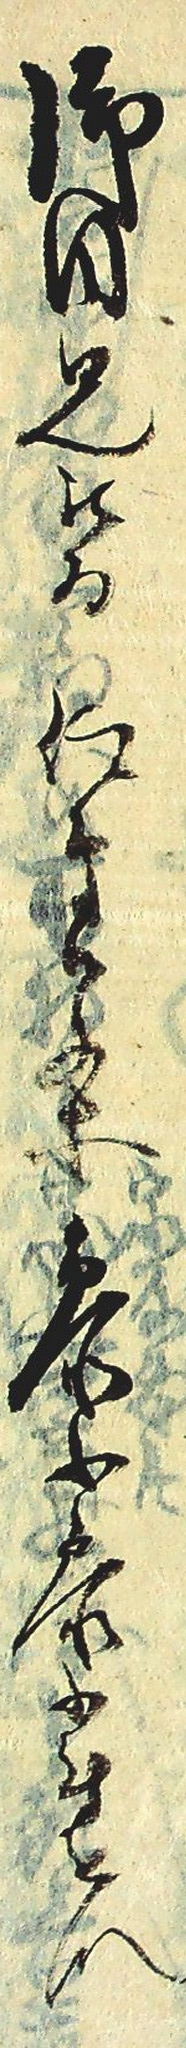御目見被為仰付候条参不参書付を以
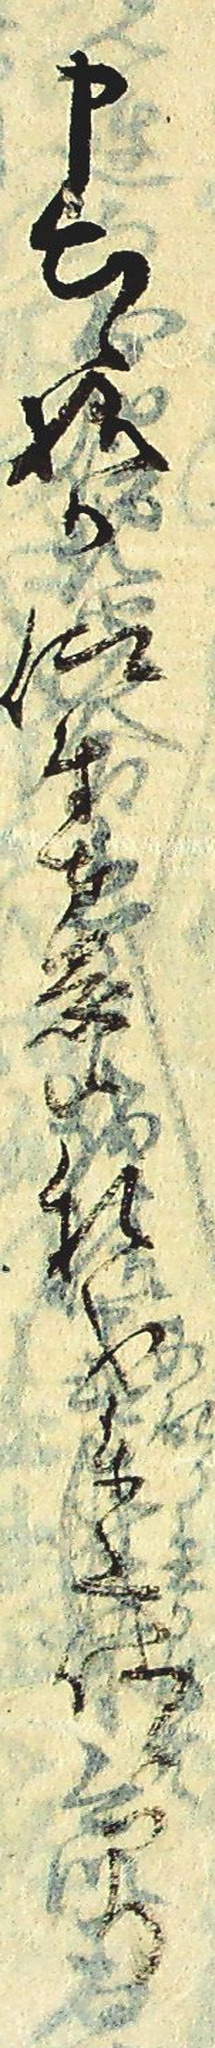申出候様被仰付奉畏候私義参上仕候間
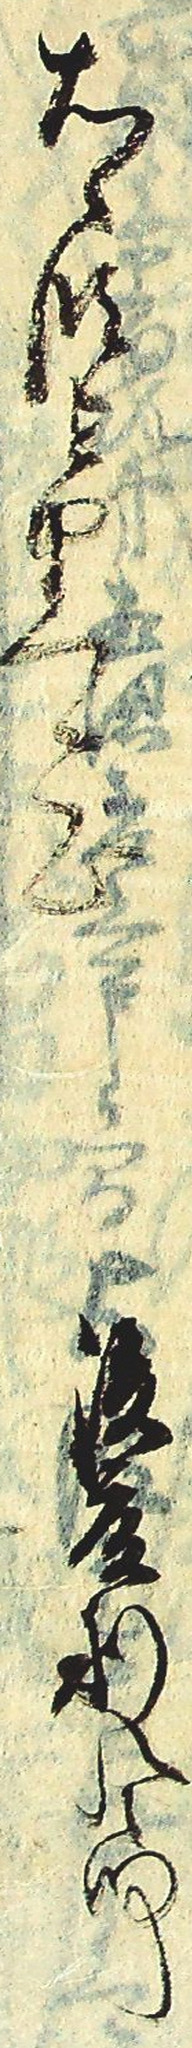右之段奉申上候以上後藤利八郎
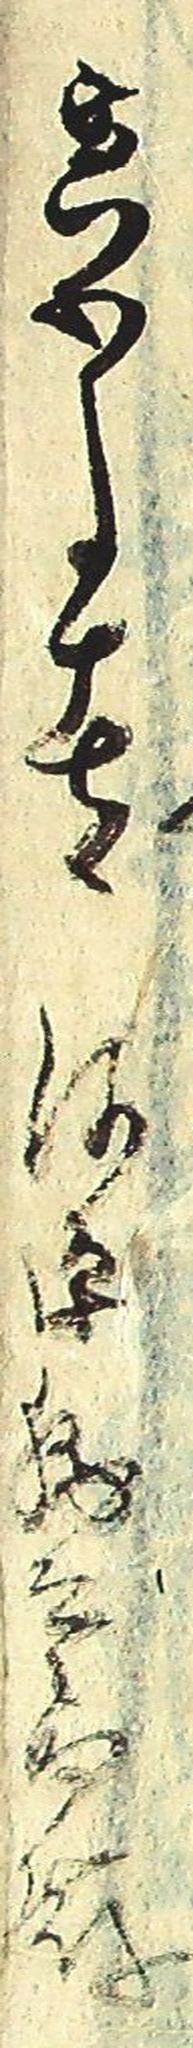寅五月十七日河原勝太郎殿

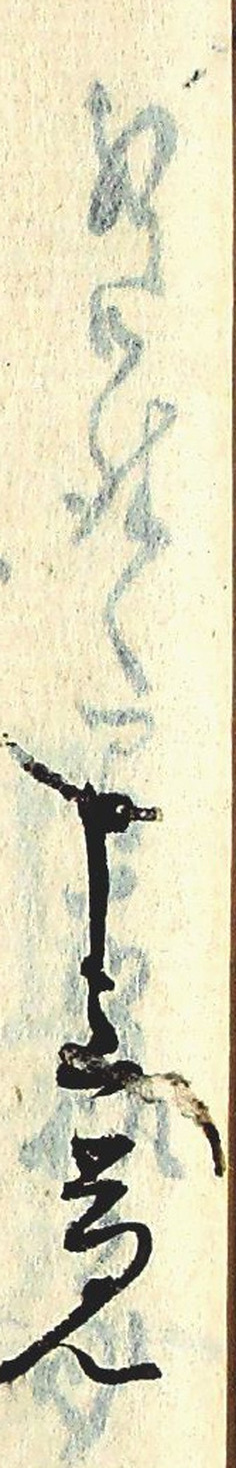申上覚
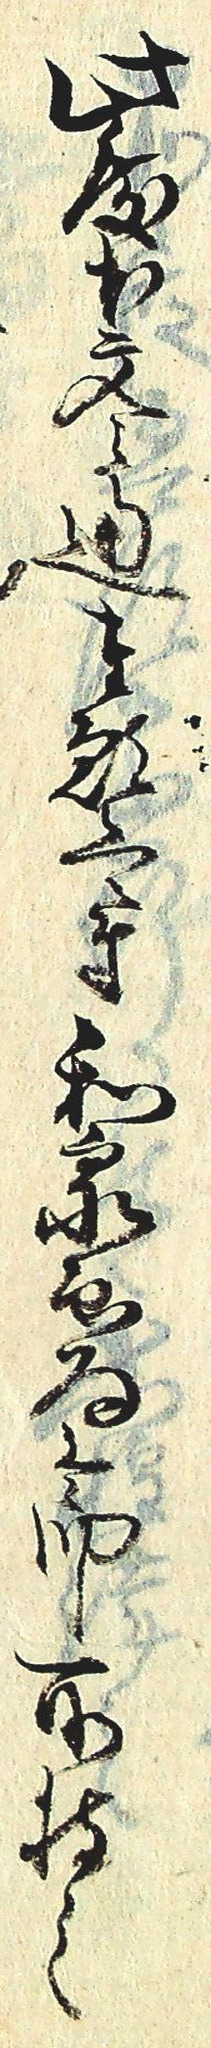此度本文之通奉願上に付和泉屋為三郎所持之
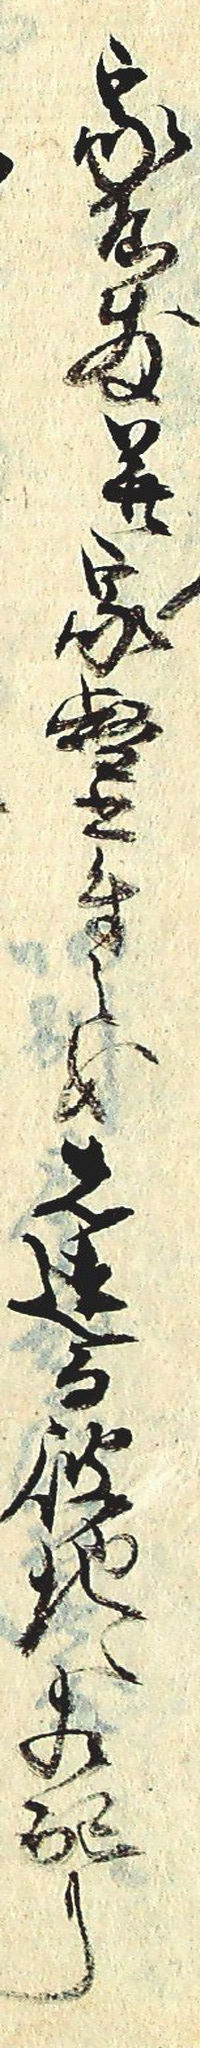家屋敷并家督書付之義先達て彼地へ相配り
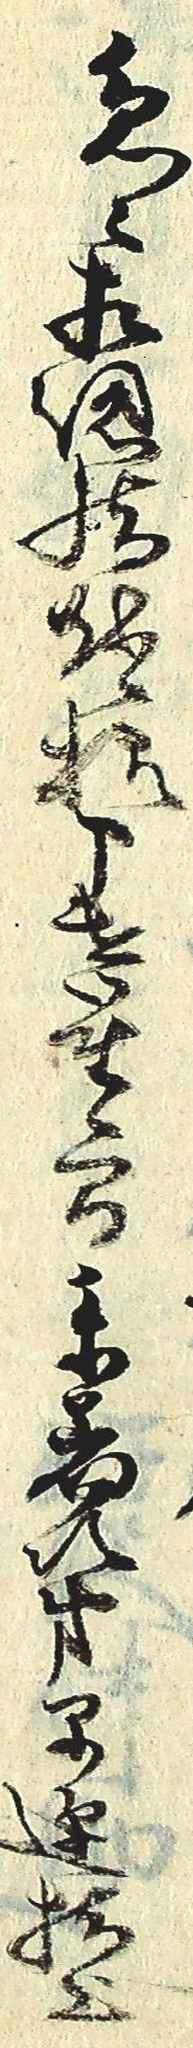急々相認指越候様申遣御座候間来着次第早速指上
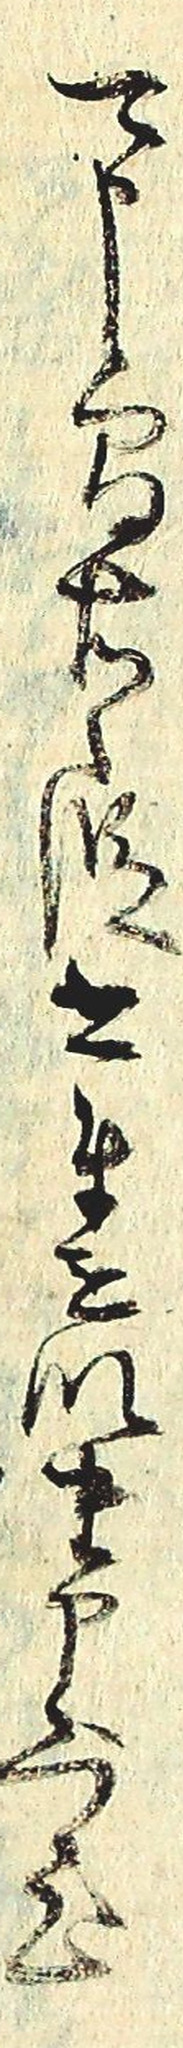可申間右之段書付を以奉申上候以上
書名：諸御願書控(弐番）
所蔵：鳴門教育大学 Naruto University of Education
